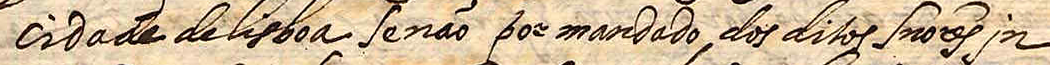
cidade de lisboa senão por mandado dos ditos Snorēs jn
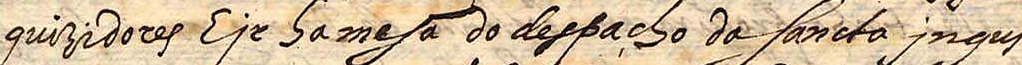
quizidores E jr ha mesa do despacho da Sancta jnqui
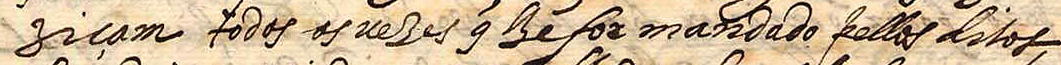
ziçam todas as uezes q̄ lhe for mandado pellos ditos
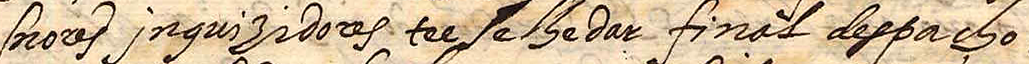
snores̄ jnquizidores tee se lhe dar final despacho
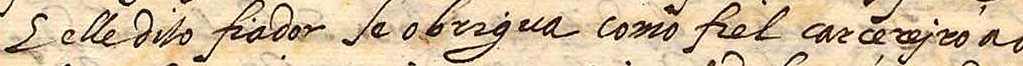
E elle dito fiador se obrigua como fiel carçerejro ao
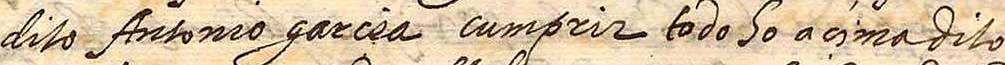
dito Antonio garçea cumprir todo ho acima dito
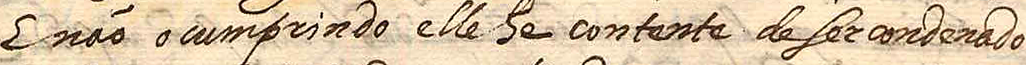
E não o cumprindo elle he contente de ser condenado
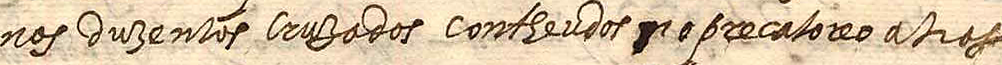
nos duzentos cruzados contheudos no precatoreo atras
